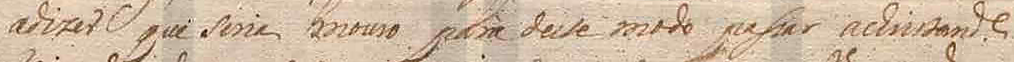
a dizer que seria mouro para desse modo passar a christand.e
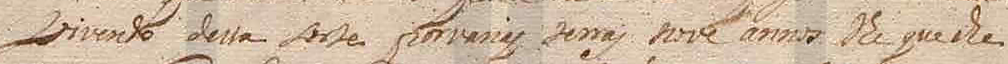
Vivendo desta sorte por varias terras nove annos the que che
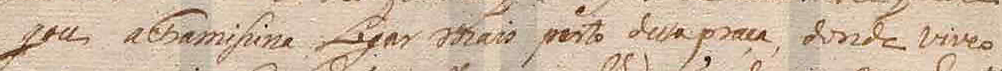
gou a Tramissina Logar mais perto desta praça, donde viveo
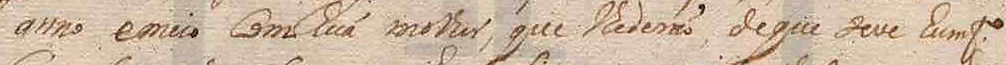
anno e meio Com huā molher, que lhe deraõ, de que teve hum f.o
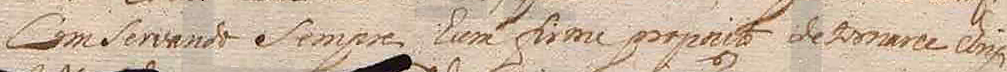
Comservando sempre hum firme propozito de tornarce chris
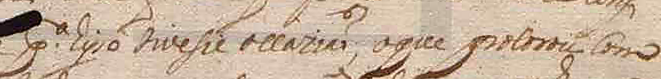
p.a hyso tivesse occaziaõ, o que procorou com
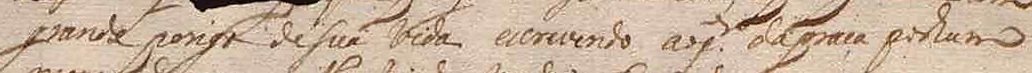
grande perigo de sua Vida escrevendo ao p.ro da praça por hum
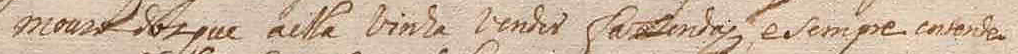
mouro dos que a ella vinha vender fazendas, e sempre entendeo
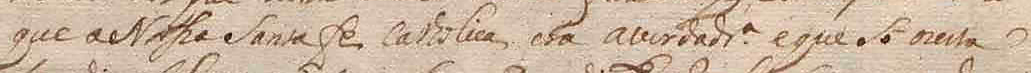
que a Nossa Santa fe catholica, era a verdadr.a e que só nesta
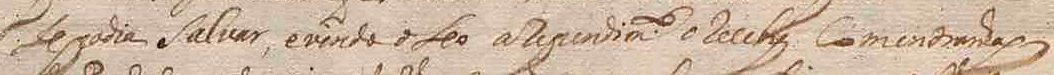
se podia salvar, e vindo o seo aRependim.to o Receby Com entranhas
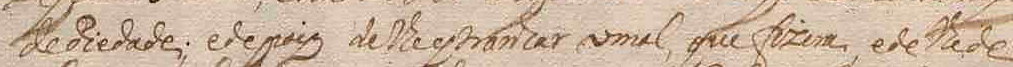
de odiedade; e depois de lhe estranhar o mal, que fizera e de lhe de
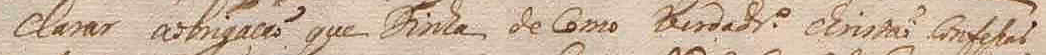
clarar a obrigaçaõ que tinha de Como verdadr.o christaõ Confessar
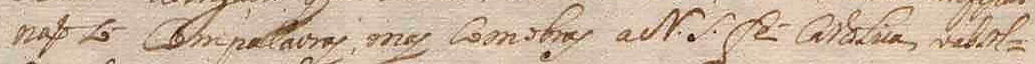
naõ só Com palavras, mas Com obras a N. S. fé Catholica o absol
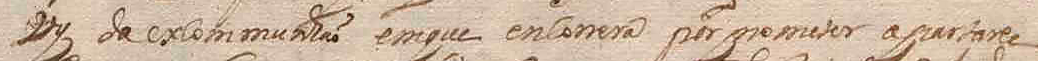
vy da excommunhaõ em que encorrera por prometer apartarce
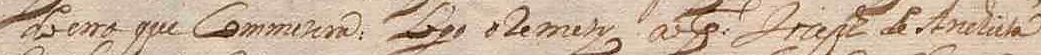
do erro que Commetera. Logo o Remety ao p.e Jozeph de Anchieta
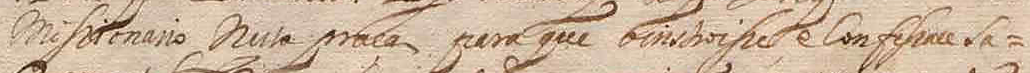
Missionario nesta praça pera que o instroisse, e Confessace sa
